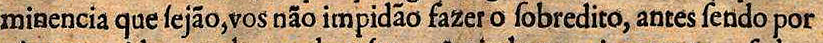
minencia que sejão, vos não impidão fazer o sobredito, antes sendo por
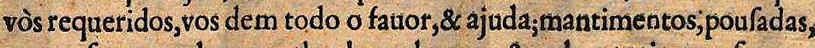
vòs requeridos, vos dem todo o fauor, & ajuda; mantimentos, pousadas,
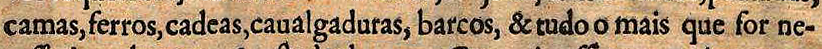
camas, ferros, cadeas, caualgaduras, barcos, & tudo o mais que for ne
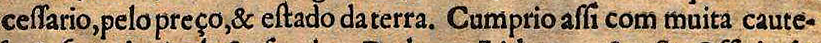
cessario, pelo preço, & estado da terra. Cumprio assi com muita caute
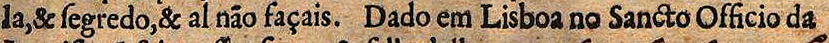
la, & segredo, & al não façais. Dado em Lisboa no Sancto Officio da
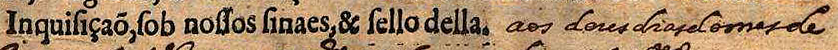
Inquisiçaõ, sob nossos sinaes, & sello della aos dous dias do mes de
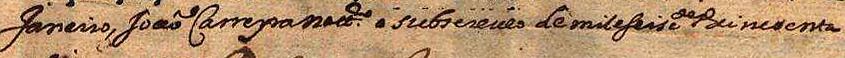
Janeiro, Joaõ Carreyra nott.ro o subscreueo de mil e seisctos E cincoenta
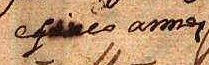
e cinco annos
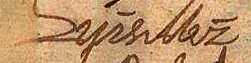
Luis Alvz̄
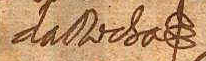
da Rocha
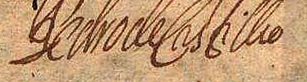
Pedro de Castilho
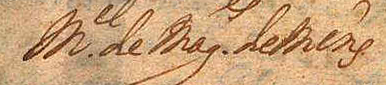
M.el de Mag.es de Men̄s
